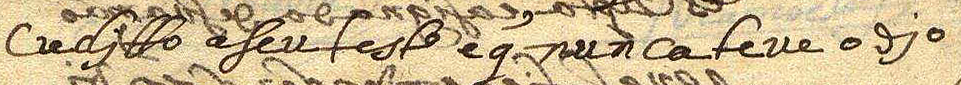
credjtto a seu test.o e q̄ nunca teve odjo
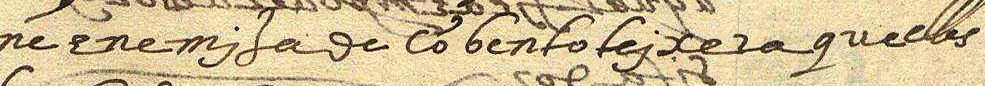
ne enemjzade cō bento tejxera que elles
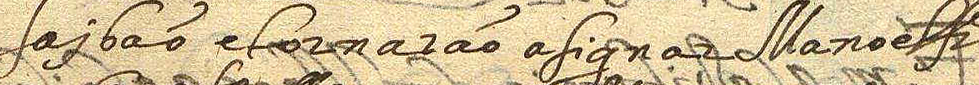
sajbaõ e tornaraõ asignar Manoel fr.co
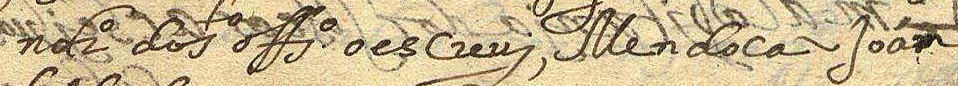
notr.o do s.to offj.o o escrevj, Mendoça Joam
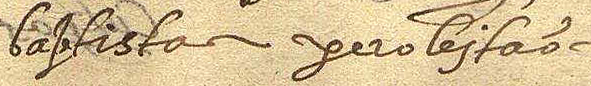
baptista pero lejtaõ
